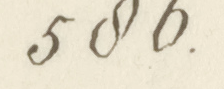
586
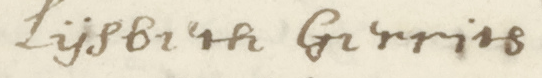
Lijsbeth Gerrits
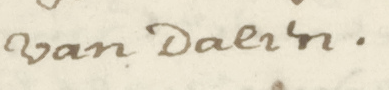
van Dalen.
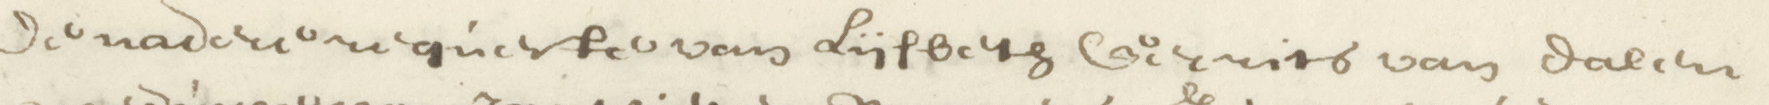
De nadere requeste van Lijsbeth Gerrits van Dalen
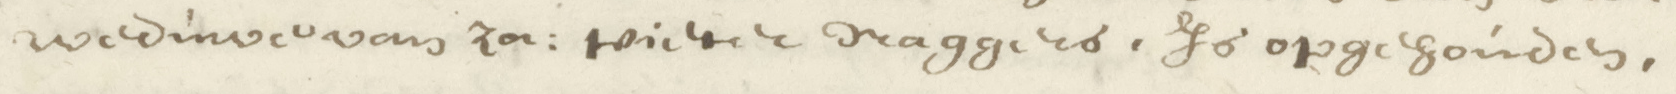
weduwe van za: Pieter Waggers, Is opgehouden.
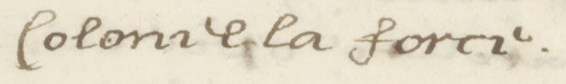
Colonel la Force.
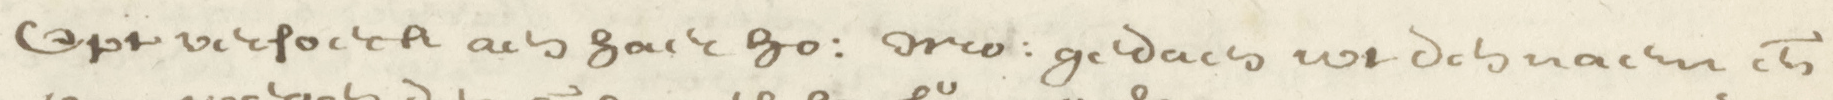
Opt versoeck aen haer Ho:Mo: gedaen wt den naem en
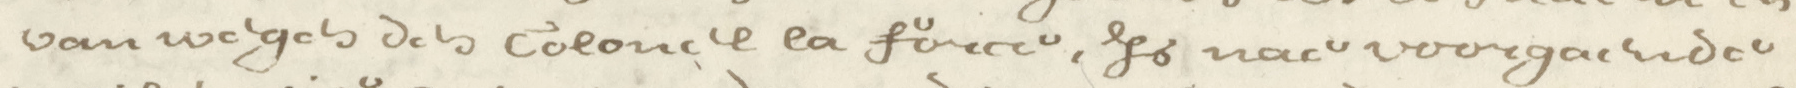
van wegen den Colonel la Force, Is nae voorgaende
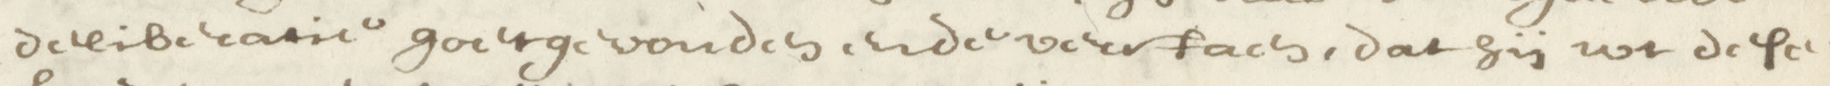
deliberatie goetgevonden ende verstaen, dat hij wt dese
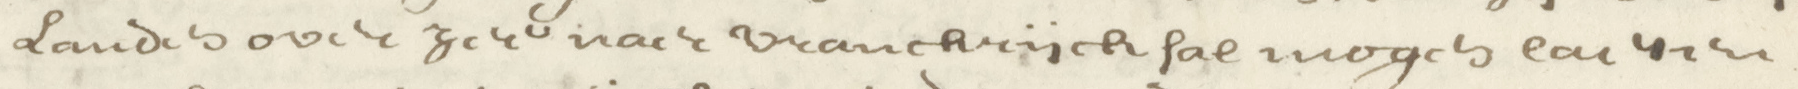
landen over zee naer Vranckrijck sal mogen laeten
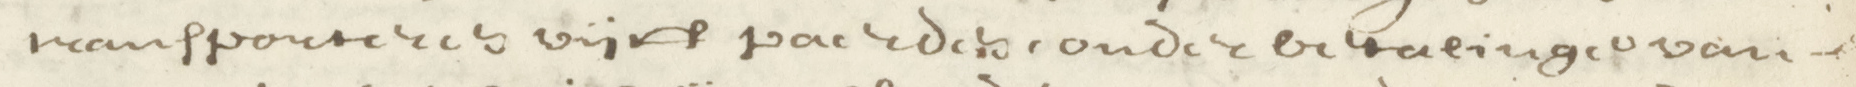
transporteren vijff paerden, onder betalinge van
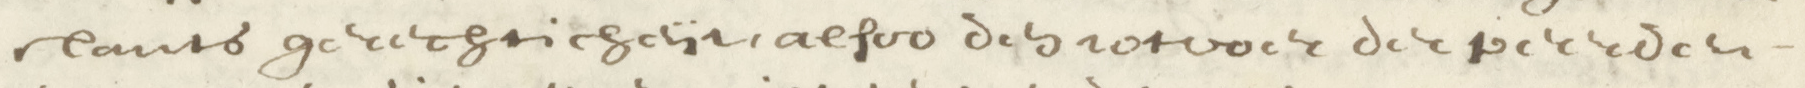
slants gerechticheijt, alsoo den wtvoer der peerden
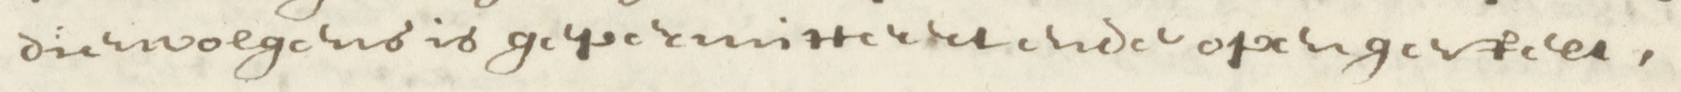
dienvolgens is gepermitteert ende open gestelt.
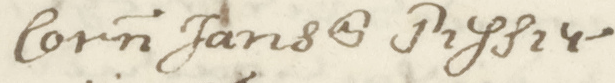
Corn Janss. Pesser
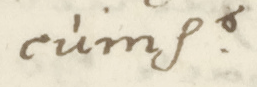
cum ss.
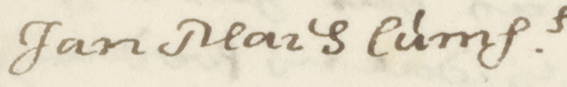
Jan Maes cum ss.
